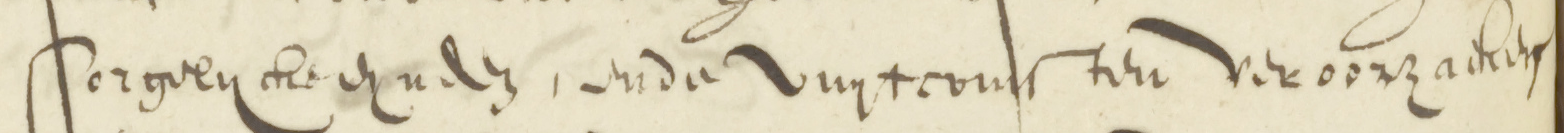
sorgelyck eynden, ende vuytcomsten veroorzaeken
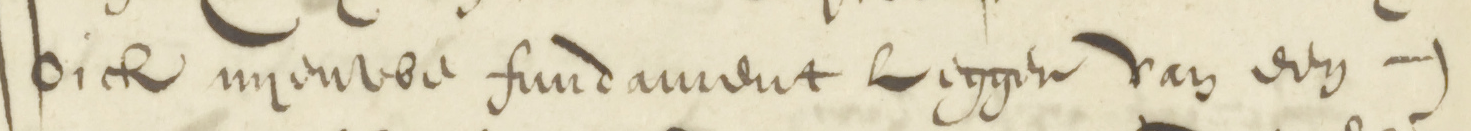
oick nyeuwe fundament leggen van een —
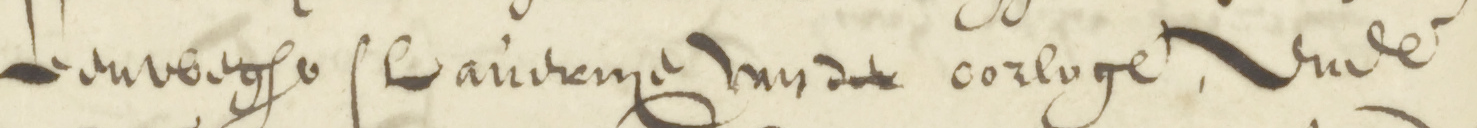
eeuweghe slauernye vande oorlogh, ende
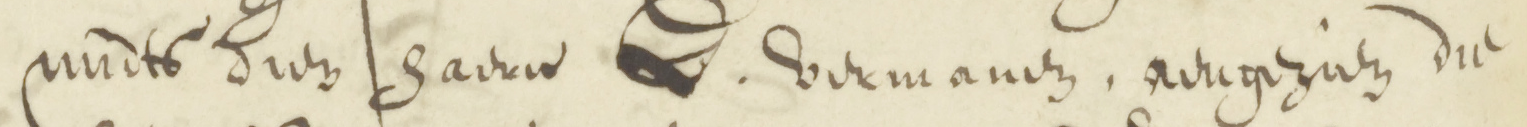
mits dien haere E. vermanen, aengezien die
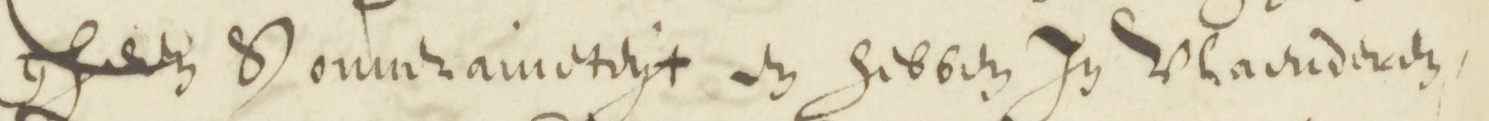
gheen Souueraineteijt en hebben In Vlaenderen,
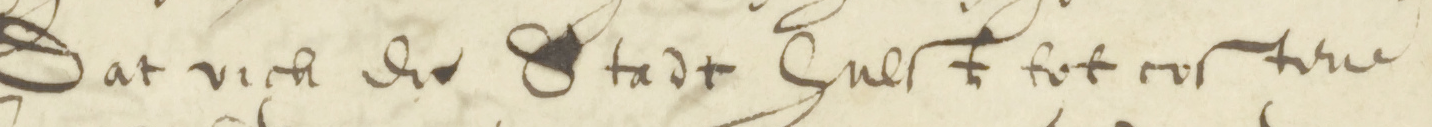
dat oick die Stadt Hulst tot costene
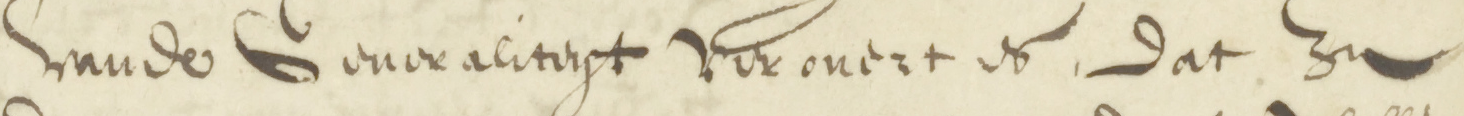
vande Generaliteyt verouert es, dat zy
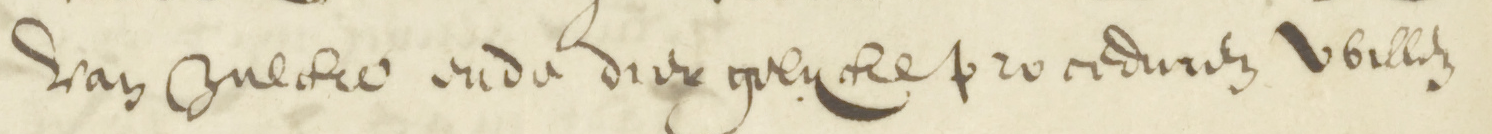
van zulcke ende diergelycke proceduren willen
